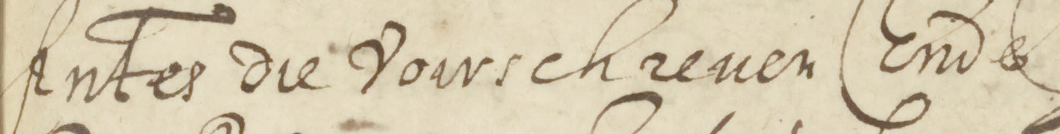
Pntes die voirschreven Ende
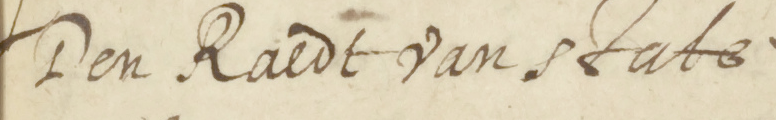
Den Raedt van State
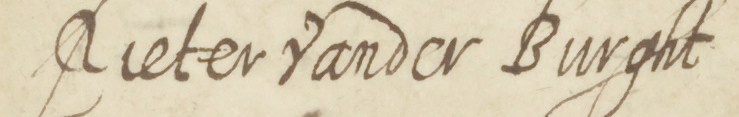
Pieter vander Burght
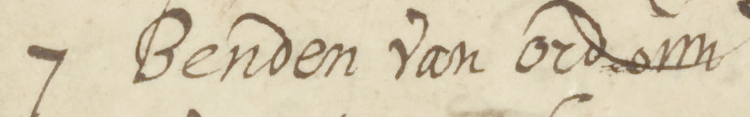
7 Benden van Ordonn
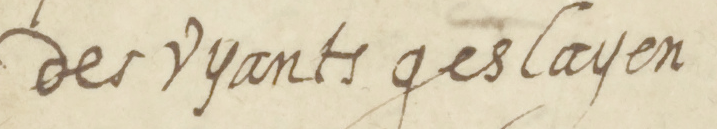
der Vyants geslagen
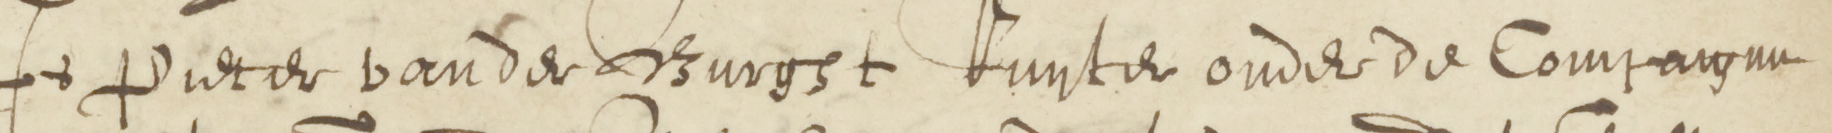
Is Pieter van der Burght Ruyter onder de Compaignie
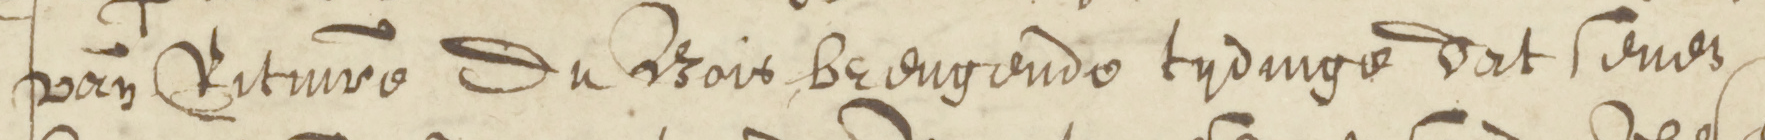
van Ritmre Du Bois, brengende tydinge dat seuen
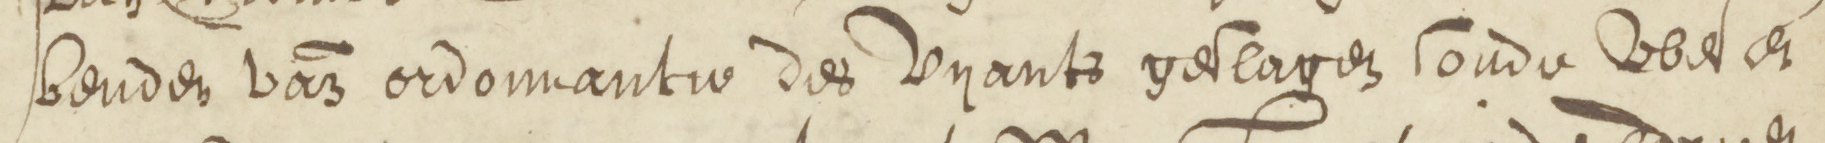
benden van ordonnantie des vyants geslagen soude wesen
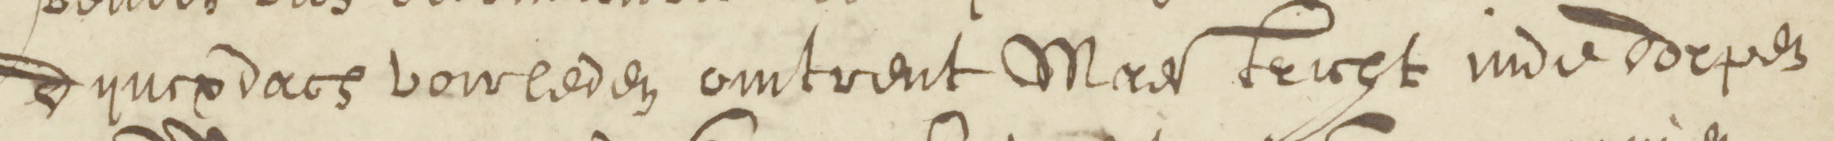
Dyncxdach voirleden omtrent Maestricht inde dorpen
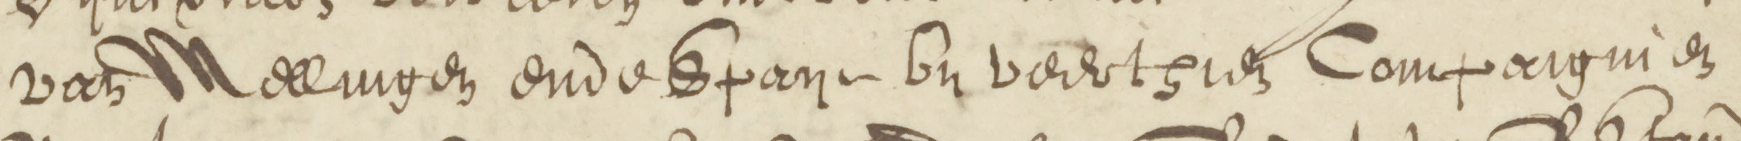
van Mellingen ende Spaye by veerthien Compaignien
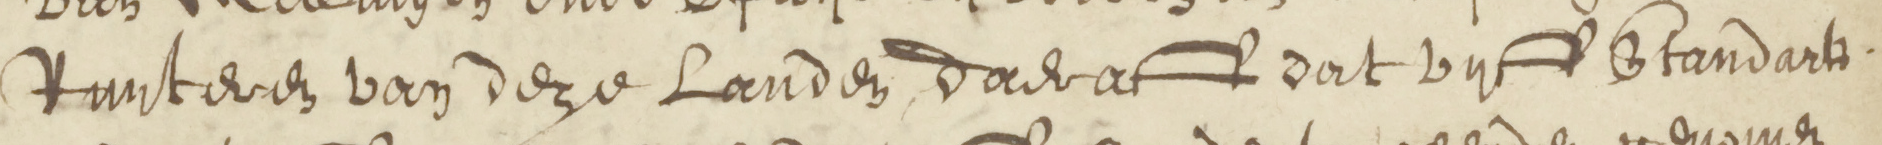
Ruyteren van deze landen, daeraff dat vyff Standarts
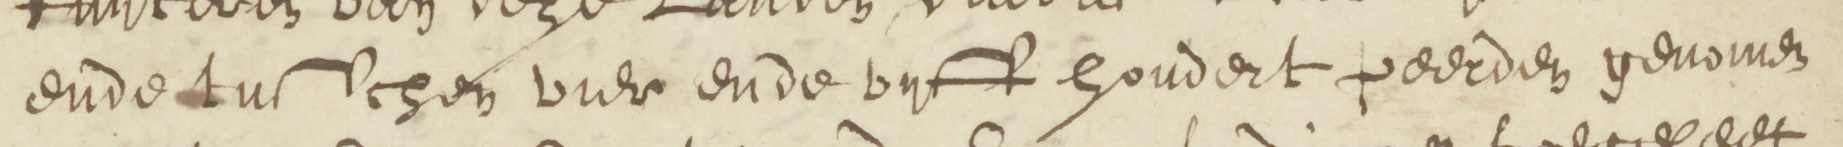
ende tusschen vier ende vyff hondert peerden genomen
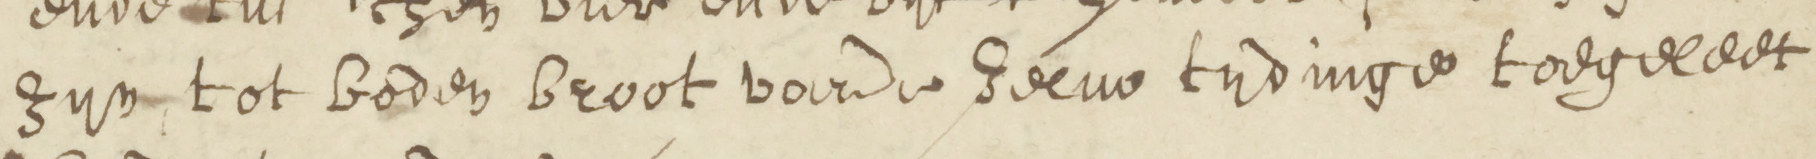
zyn tot boden broot voirde selue tydinge toegeleet
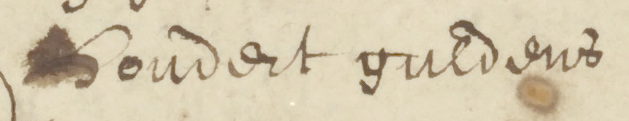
hondert guldens.
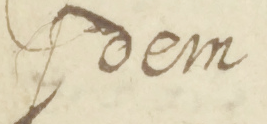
Idem
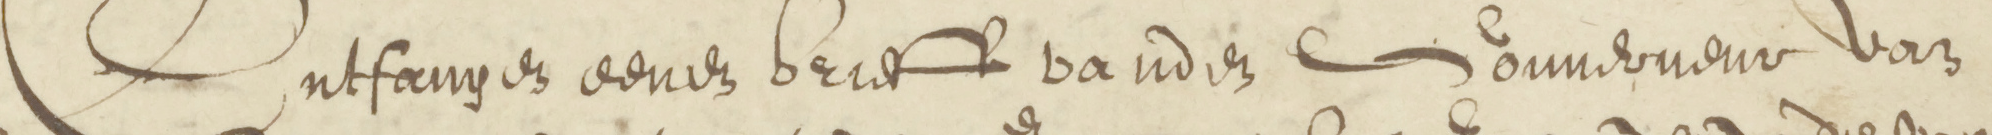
Ontfangen eenen brieff vanden Gouuerneur van
